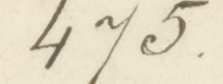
475
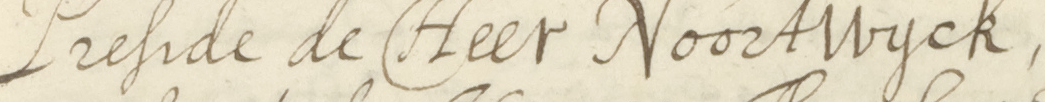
Preside de Heer Noortwijck,
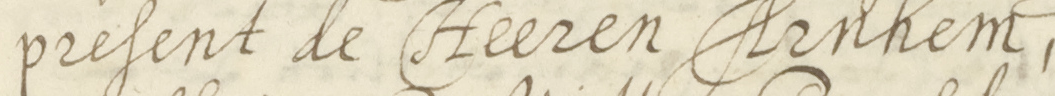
present de Heeren Arnhem,
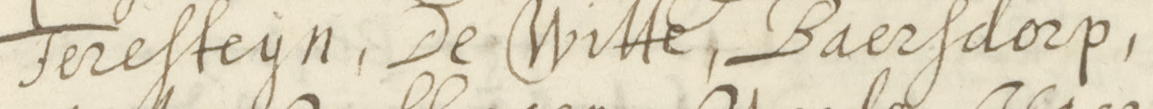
Teresteijn, De Witte, Baersdorp,
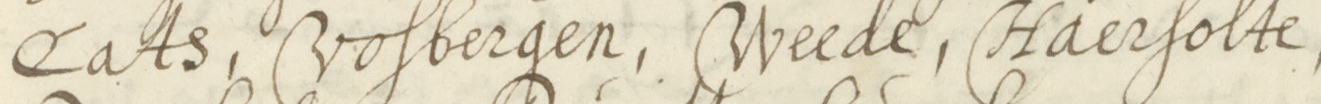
Cats, Vosbergen, Weede, Haersolte,
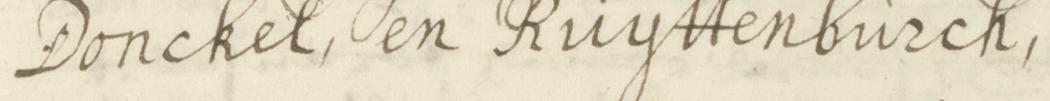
Donckel en Ruyttenburch
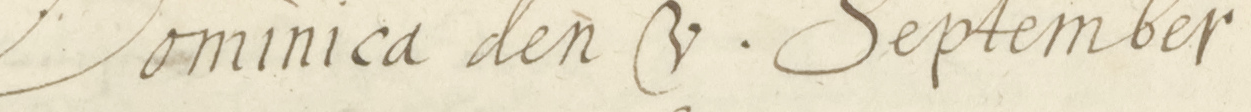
Dominica den ven September
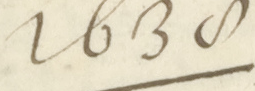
1638
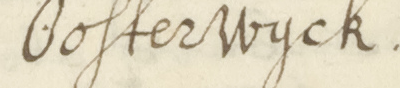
Oosterwijck
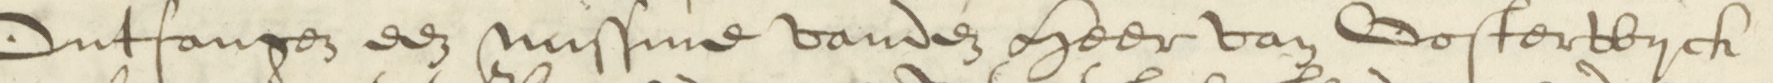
Ontfangen een missive vanden heer van Oosterwijck
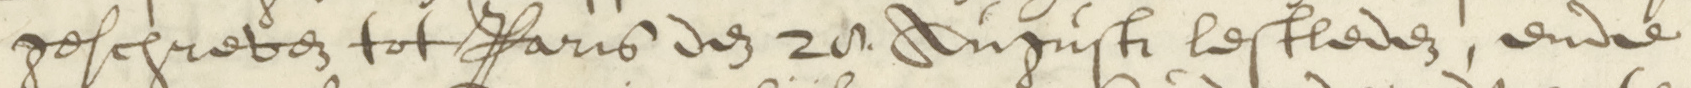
geschreven tot Paris den 28. Augusti lestleden, ende
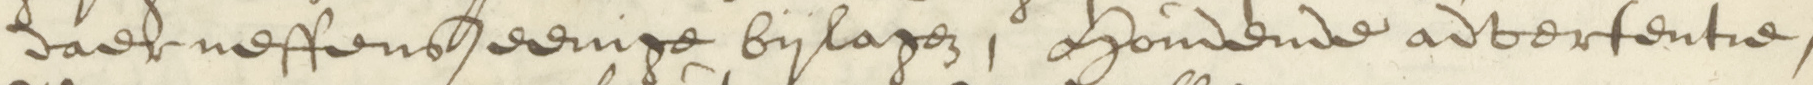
daer neffens eenige bijlagen, houdende advertentie,
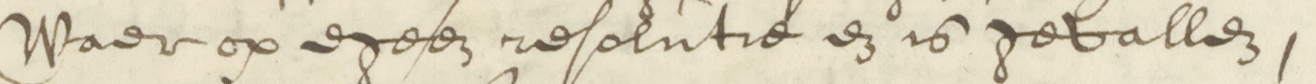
Waer op egeen resolutie en is gevallen.
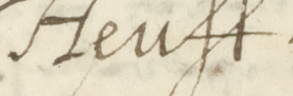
Heuft
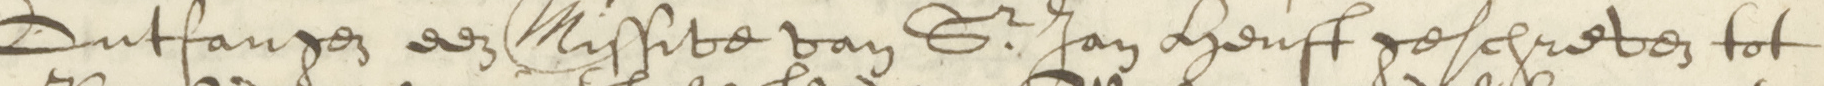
Ontfangen een Missive van Sr Jan Heuft geschreven tot
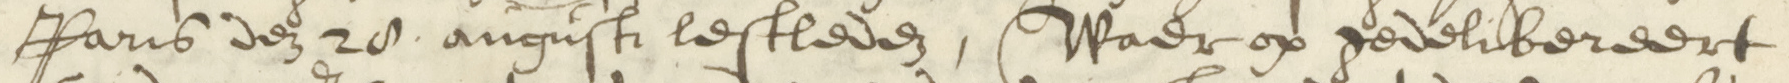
Paris den 28 augusti lestleden, Waer op gedelibereert
